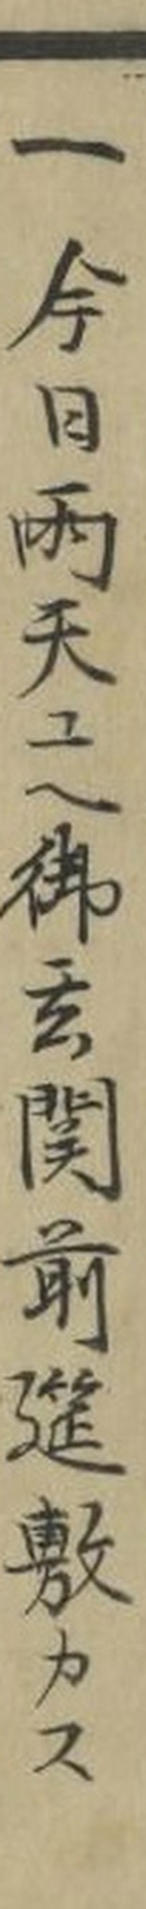一今日雨天ユヘ御玄関前莚敷カス
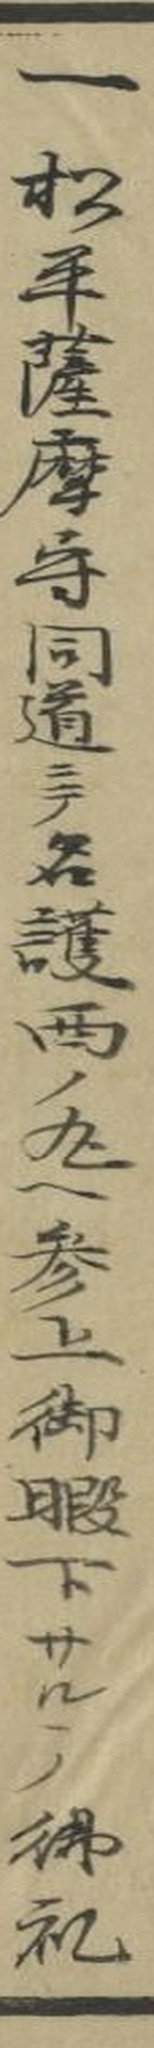一松平薩摩守同道ニテ名護西ノ丸へ参上御暇下サル丶ノ御礼
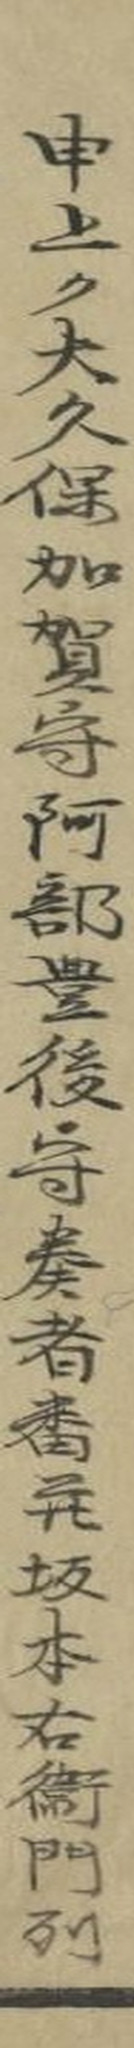申上ク大久保加賀守阿部豊後守奏者番并坂本右衛門列
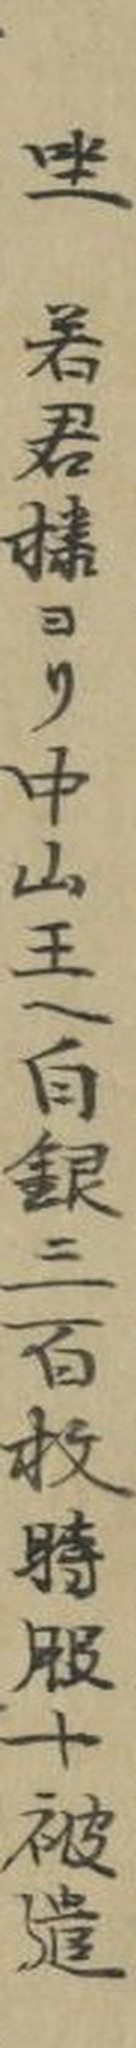座若君様ヨリ中山王へ白銀三百枚時服十被遣
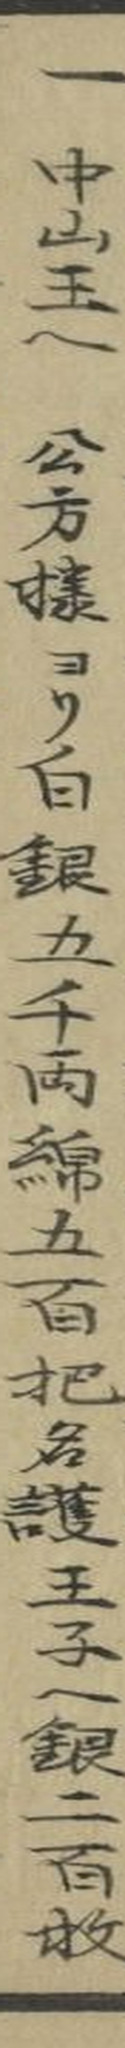一中山王へ公方様ヨリ白銀五千両綿五百把名護ヘ銀二百枚
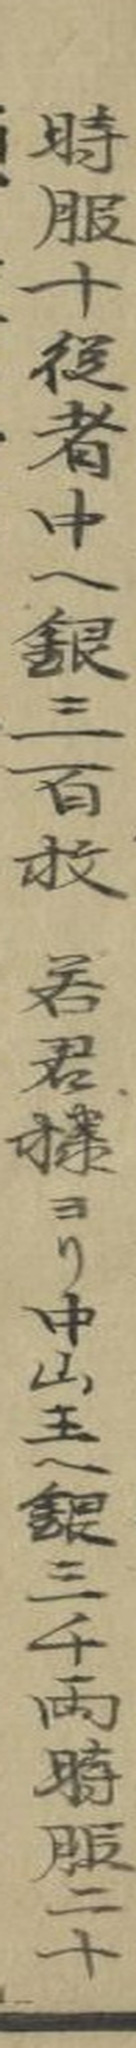時服十従者中ヘ銀三百枚若君様ヨリ中山王へ銀三千両時服二十
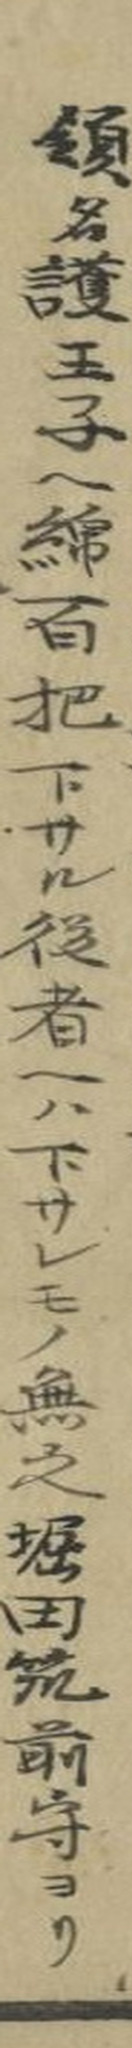領名護王子ヘ綿百把下サル従者へハ下サレモノ無之堀田筑前守ヨリ
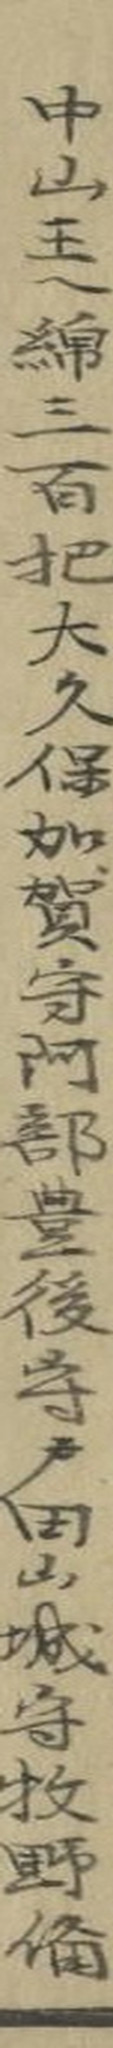中山王へ綿三百把大久保加賀守阿部豊後守戸田山城守牧野備
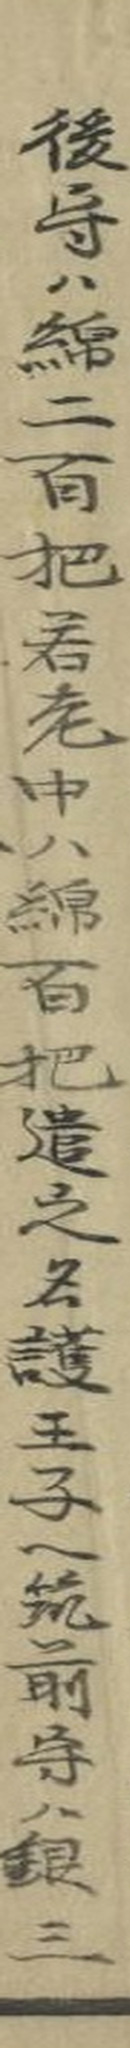後守ハ綿二百把若老中ハ綿百把遣之名護王子ヘ筑前守ハ銀三
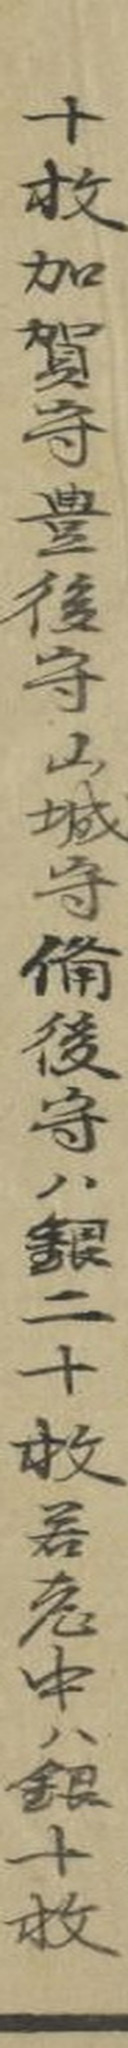十枚加賀守豊後守山城守備後守ハ銀二十枚若老中ハ銀十枚
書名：琉球往来（下）
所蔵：University of the Ryukyus Library
